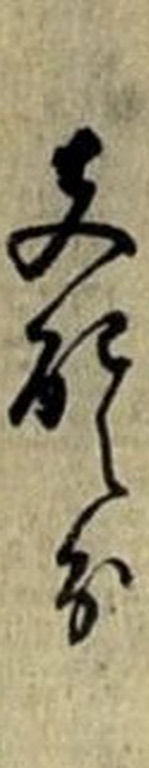支配之分
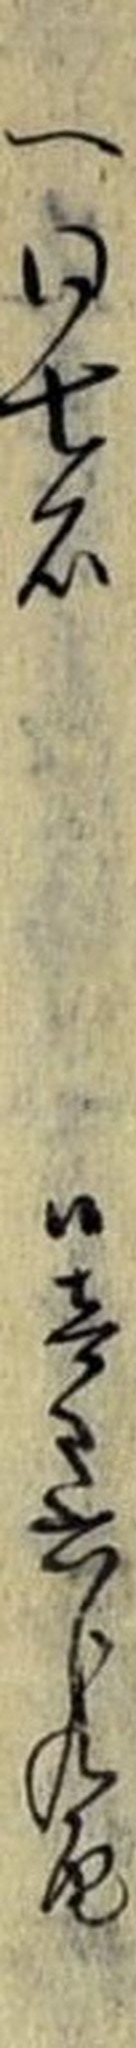一同七石同壱匁六歩九厘
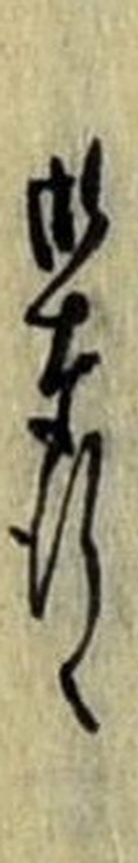御奉行へ
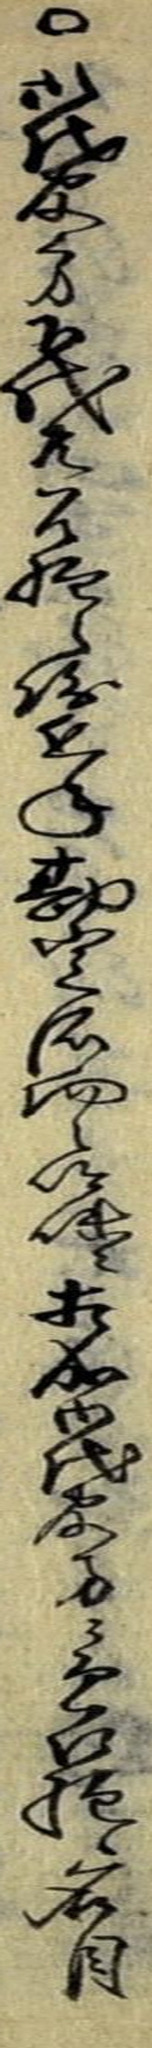〇御代官方下代共召抱候儀近年勘定所向之吟味ニ相成御代官方ニ而召抱候名目
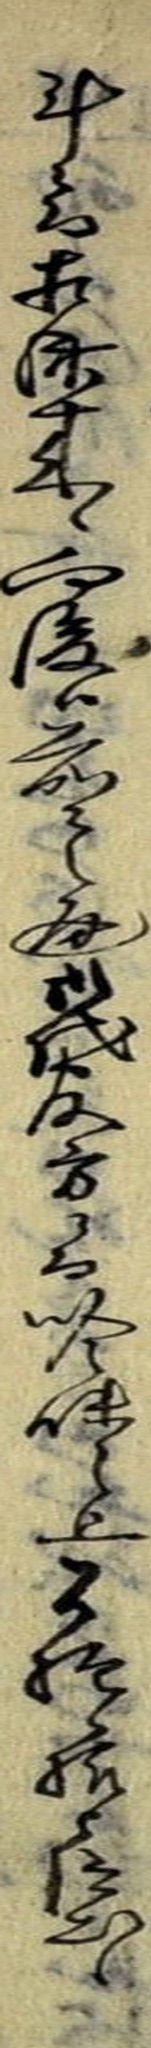斗ニ而相済来候向後ハ前々之通御代官方ニ而吟味之上召抱候様被仰出候
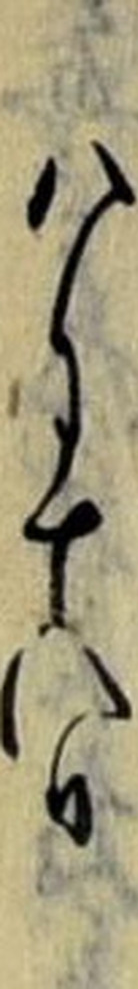八月十八日
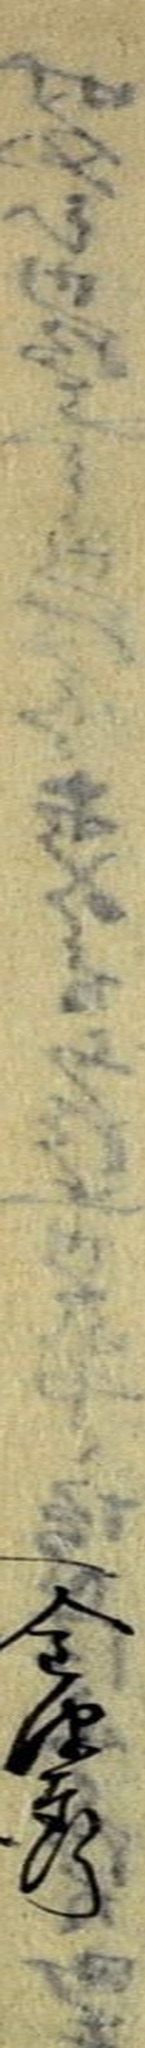金津奉行
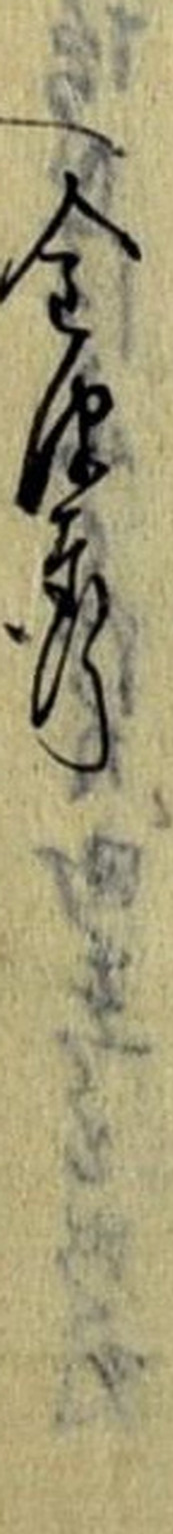金津奉行
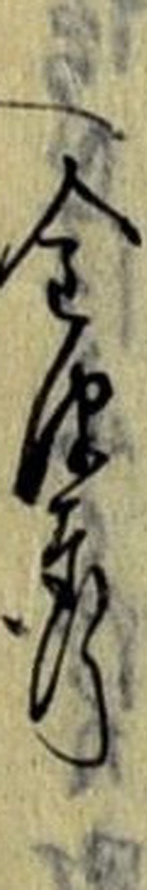金津奉行
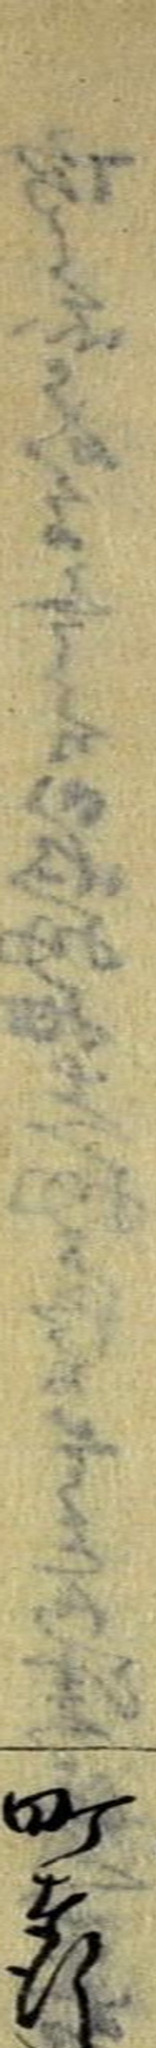町奉行
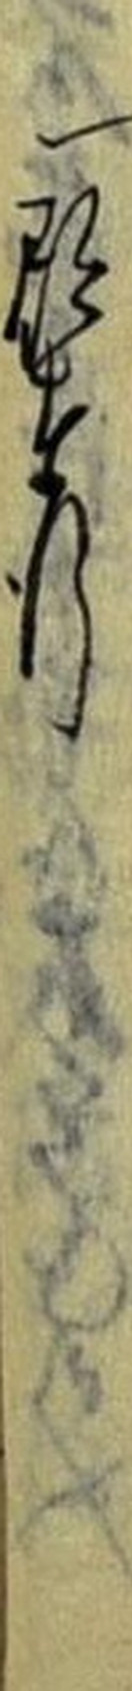郡奉行
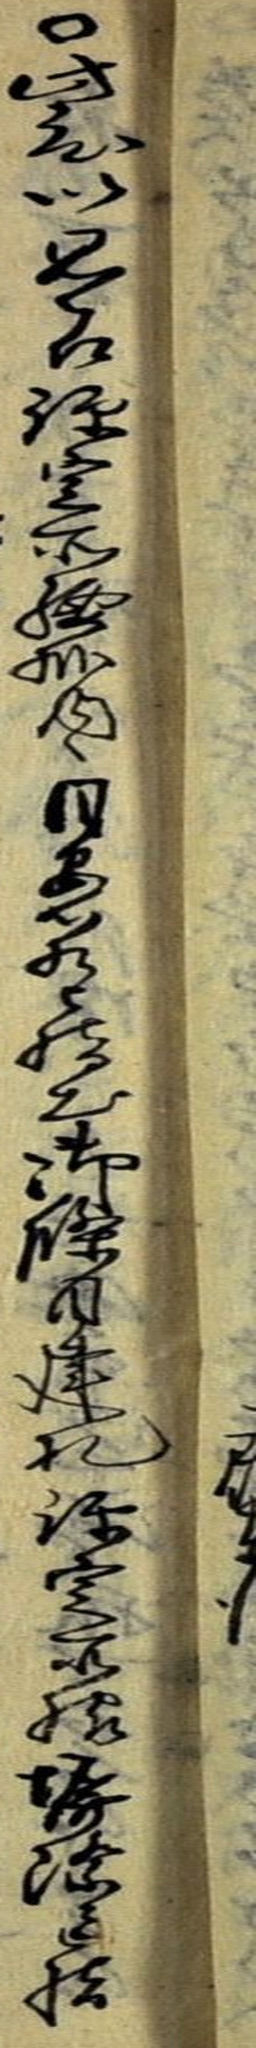〇此度以思召評定所腰掛内へ目安箱被指出御条目建札評定所脇塀際ニ被指
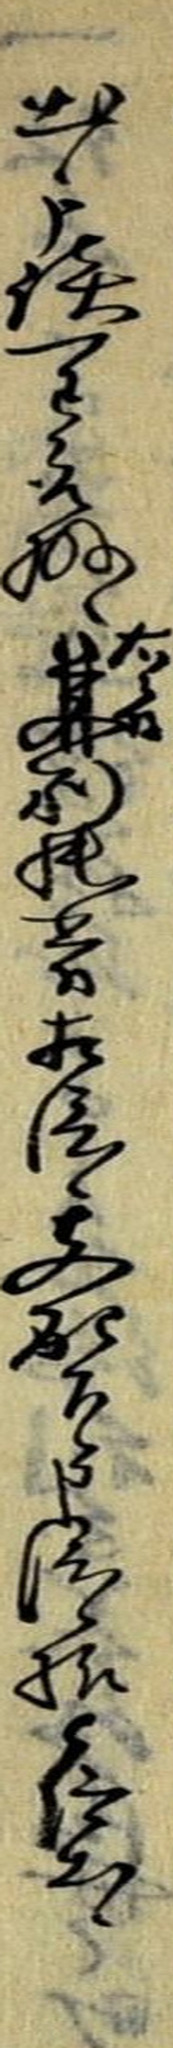出候申談可被取扱候右ニ付別紙書付相渡候支配下へ申渡候様被仰出候
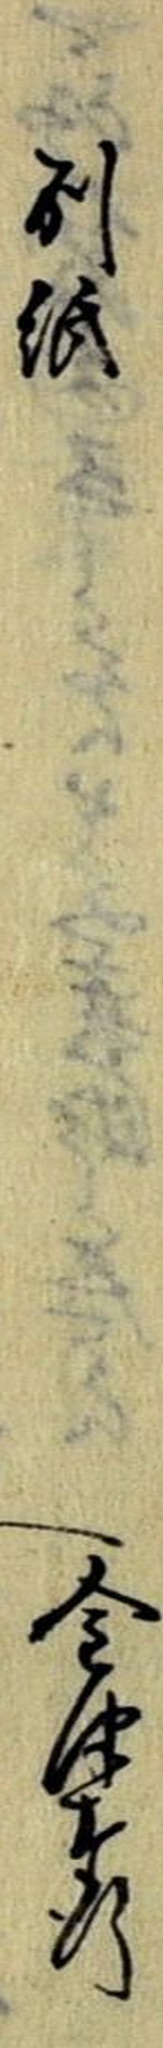別紙金津奉行
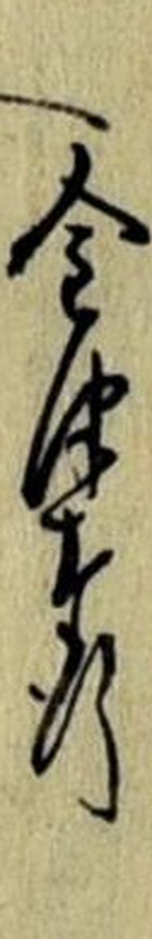金津奉行
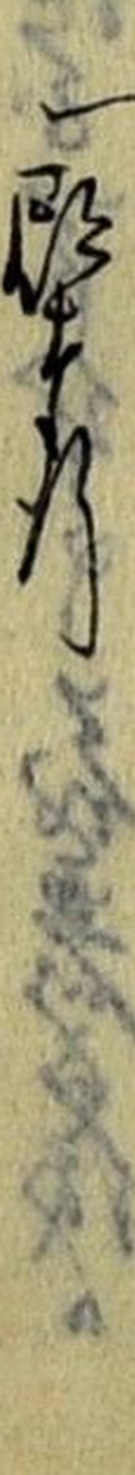郡奉行
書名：命令之部 三
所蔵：福井県文書館 Fukui Prefectural Archives
